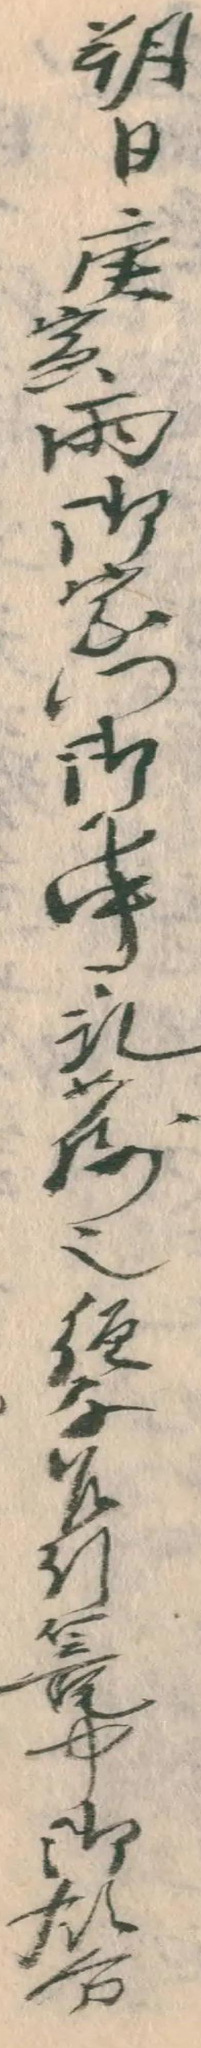朔日庚寅雨御家門御下中御礼如例也経千乍引篭中御領分
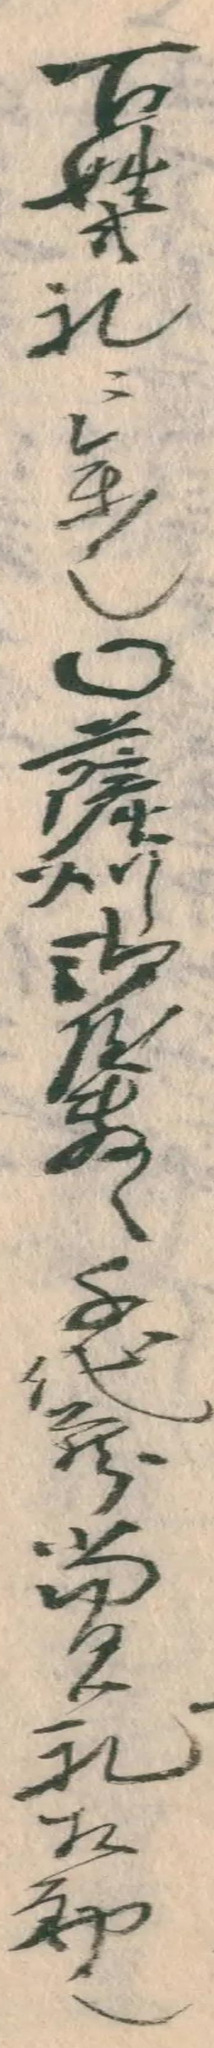百姓共礼ニ参也○薩州御屋敷へ千代蔵當日御礼相勤也
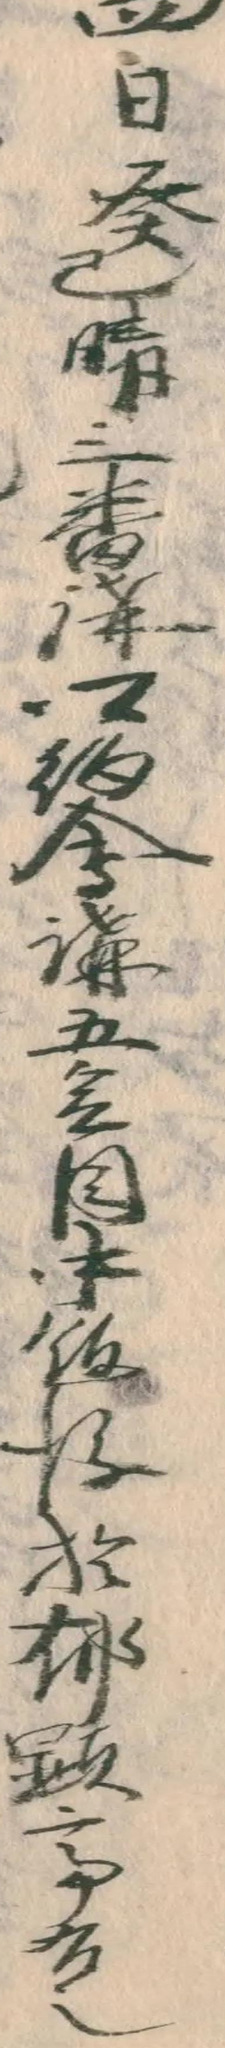四日癸巳晴三番講郷約會講五會目中飯後於郁顕亭有之
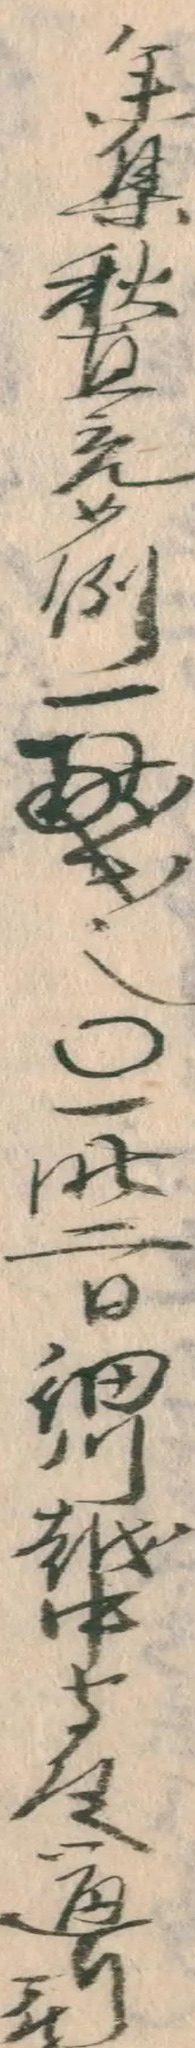参集秋直充如例一献出也○一昨二日細川越中守殿御通行ニ付
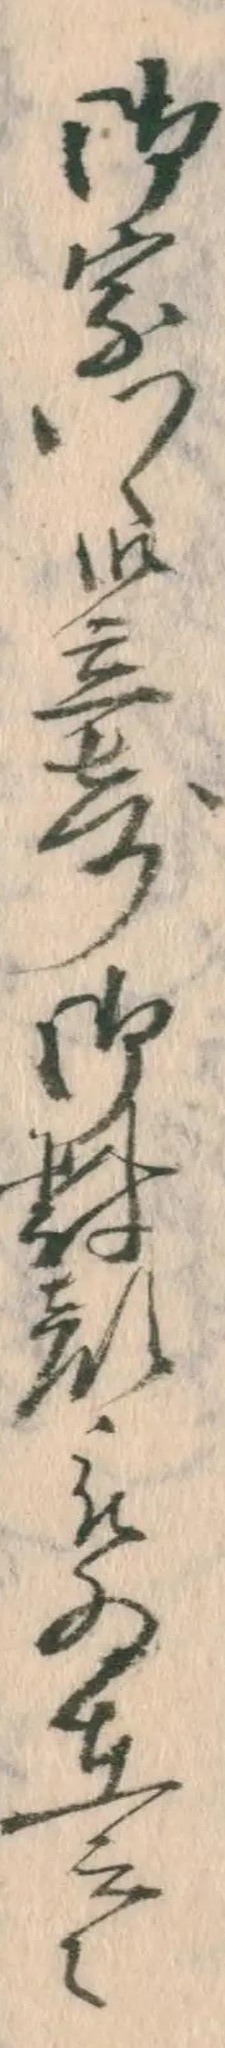御家門へ御立寄御對顔被為在云々
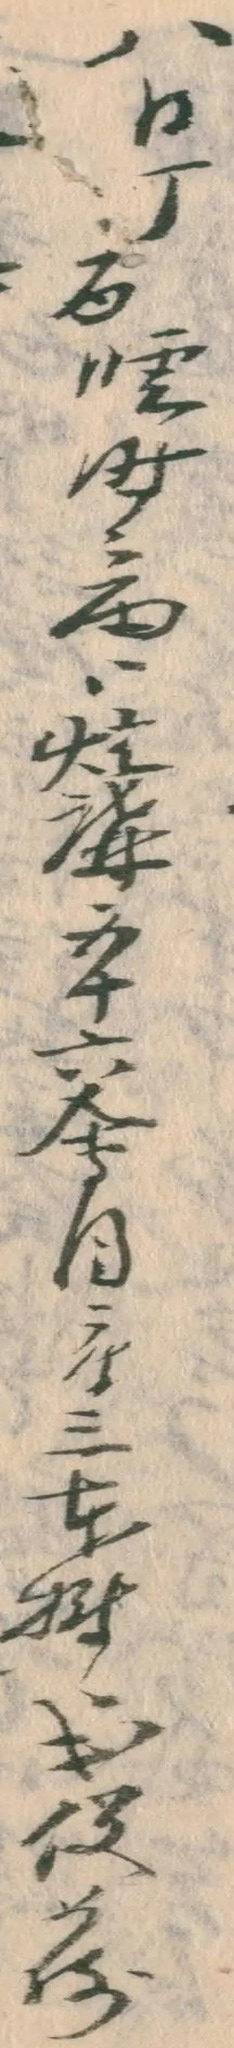八月丁酉曇時々御燈講五十六會目ニ付三本樹へ出役如例
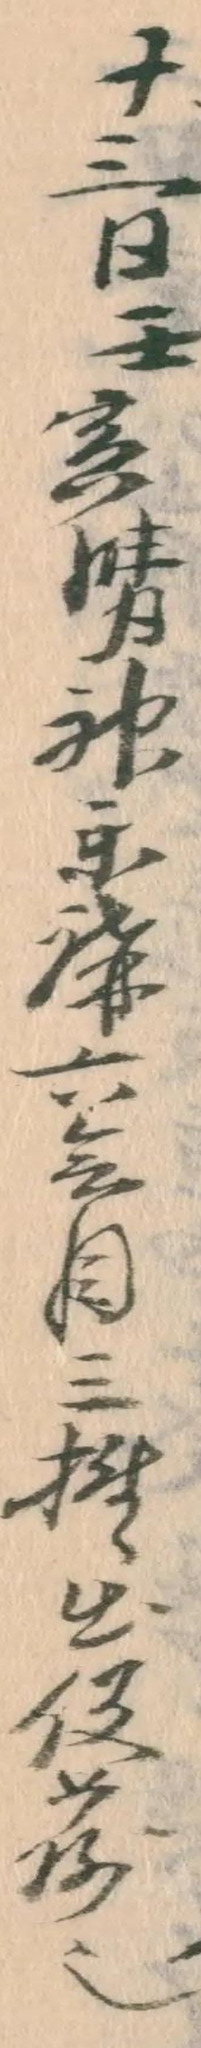十三日壬寅神楽講六會目三樹ヘ出役如例也
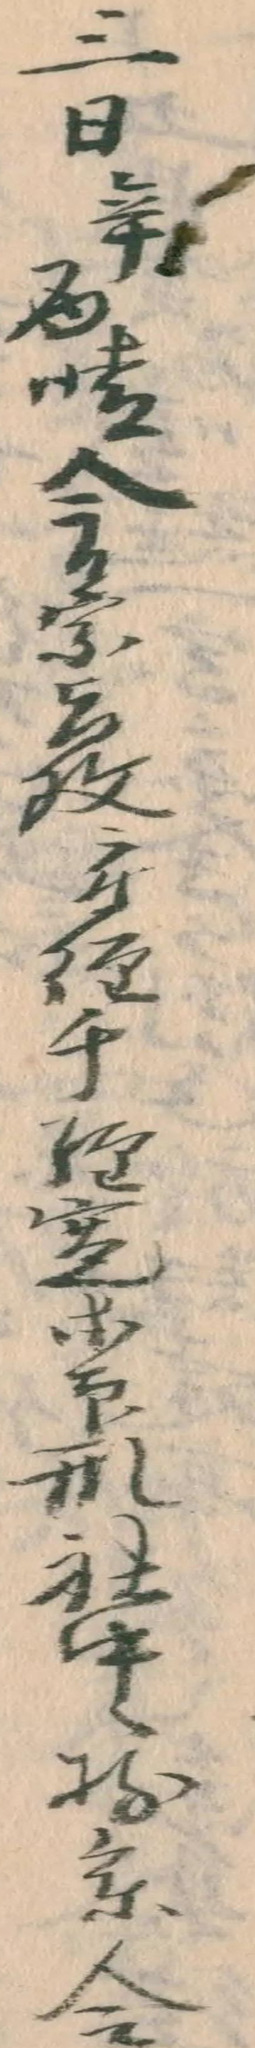三日辛酉晴今日宗旨改ニ付経千軽寛等印形社中へ持参令
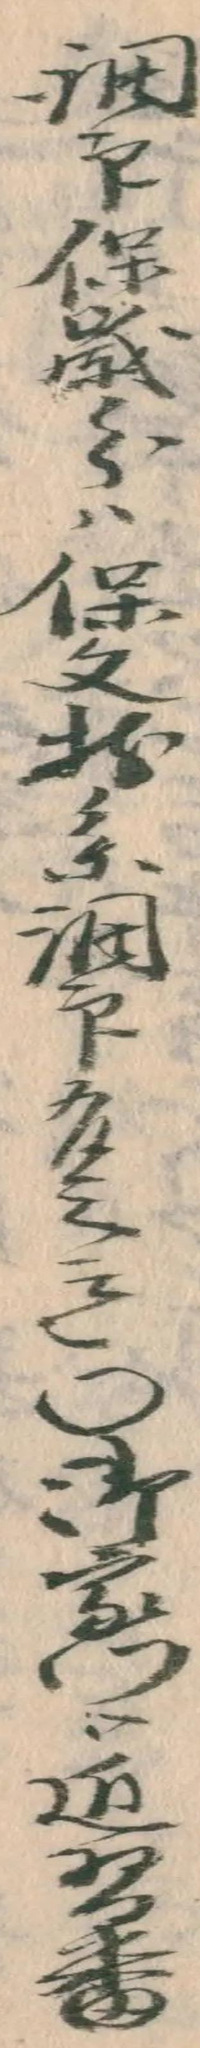調印保歳分ハ保文持参調印有之云々○御家門御近習番
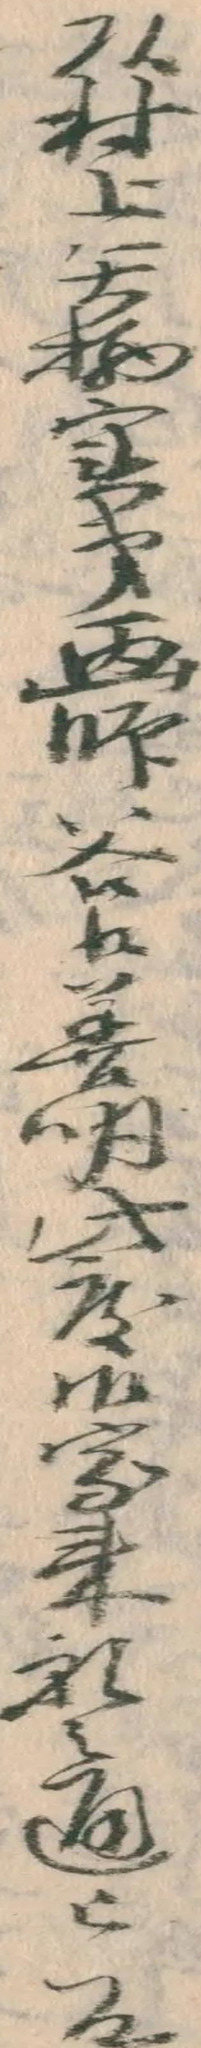頭村上矢柄実弟画師谷口善明此度御家来願之通被召
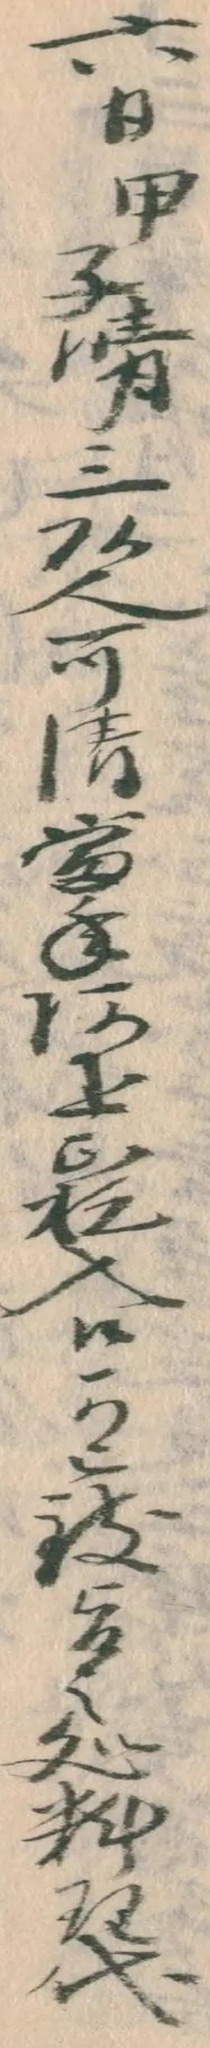六日甲子三頭人可清當年河上正税入候可被致旨之処料理代
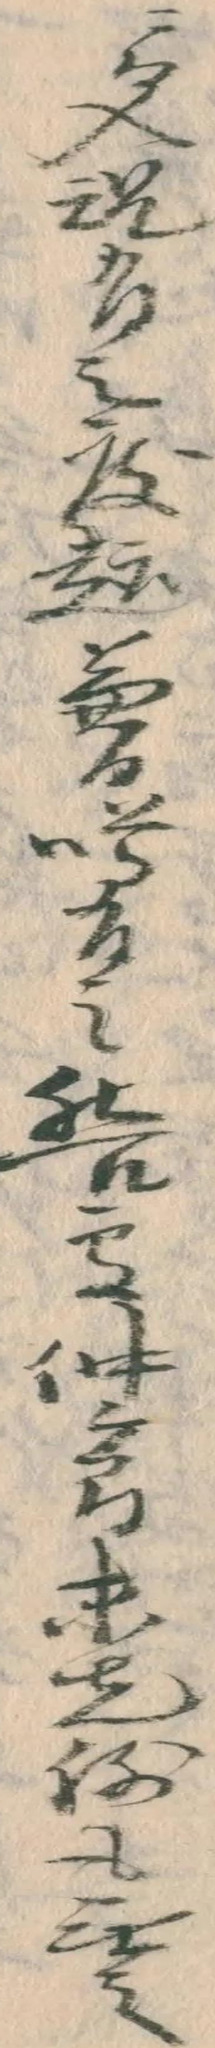ニ而入魂有之度趣兼日噂有之然ル處仲ヶ間未先例も無之
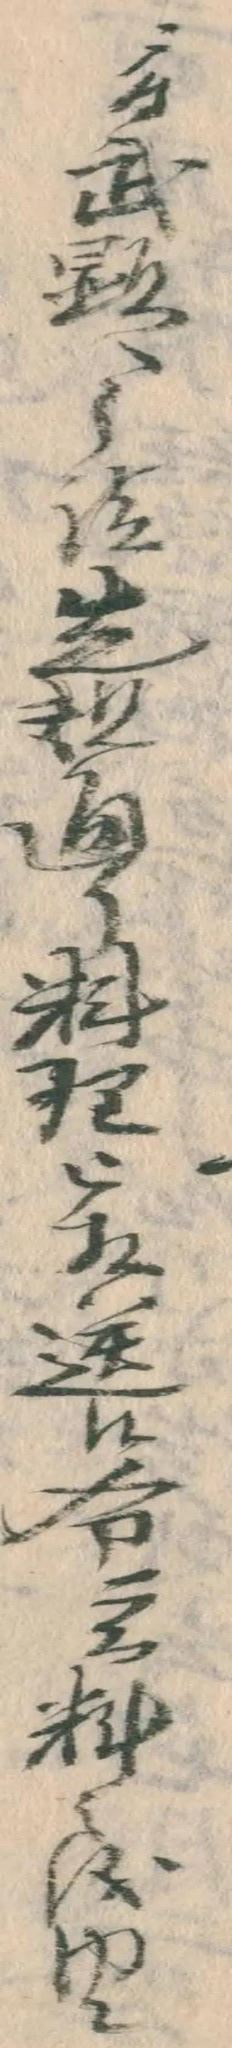ニ付武顕へ申請先規通之料理被相送候分ニ而料之儀内々
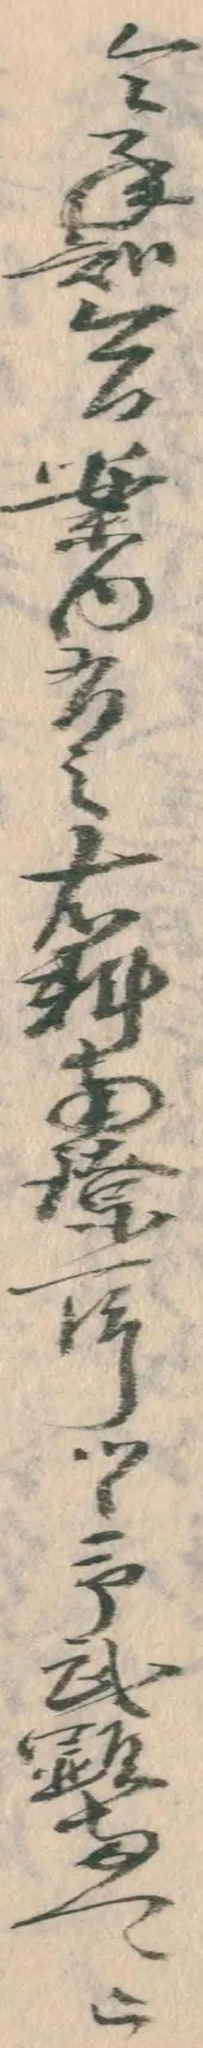今日承知今日案内有之右耕南鐐一片ツヽ予武顕両人へ被
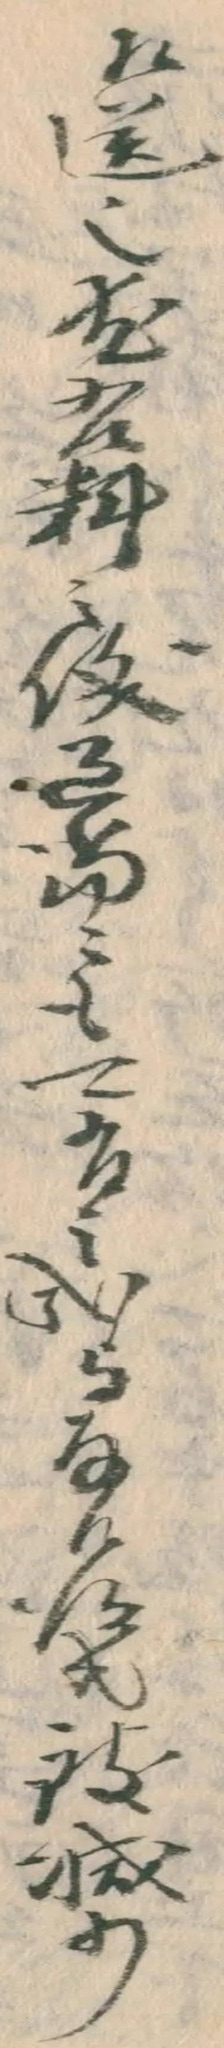取送也尤右料之儀過當ニも可有之哉与存候得共致減少
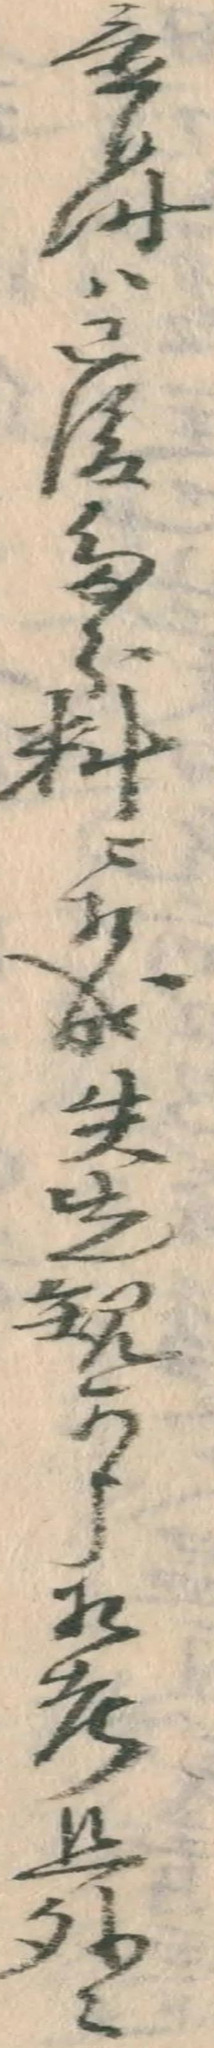置候時ハ已後多分料二相成失先規可申相考且外二
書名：賀茂社記録. 第70冊
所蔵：国立国会図書館 National Diet Library, JAPAN
